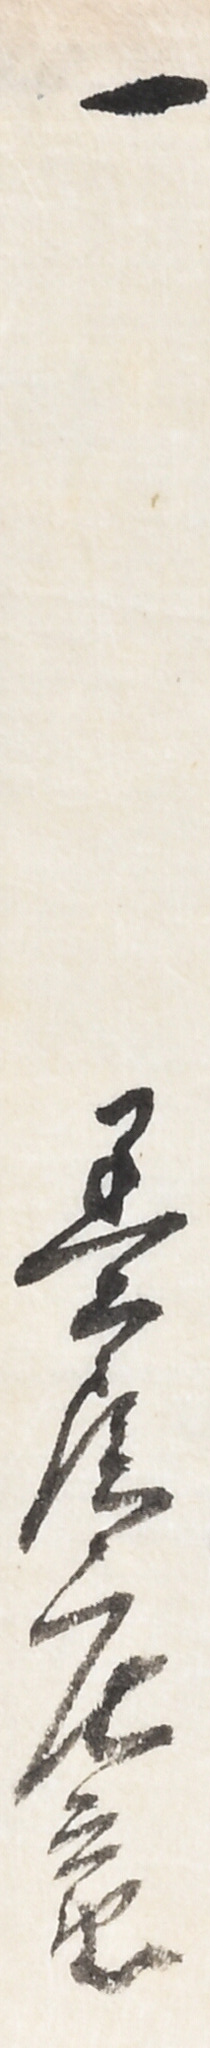一墨屋庄兵衛
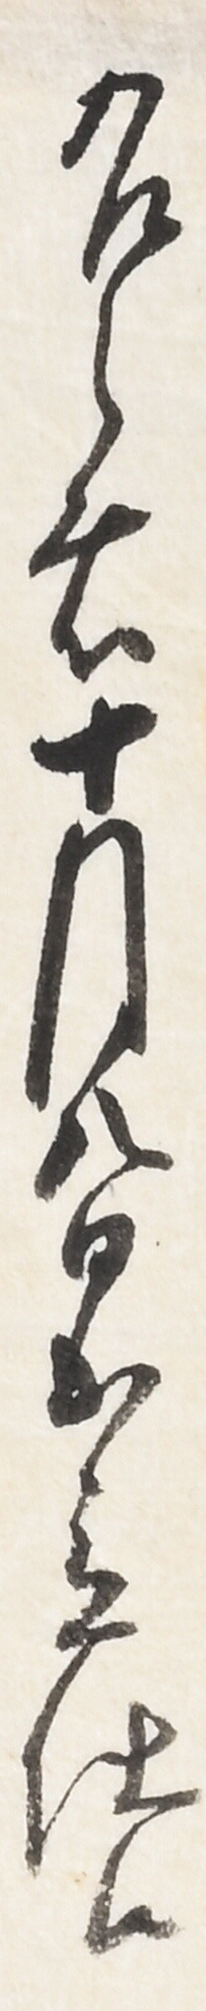右之者十月八日出立仕候
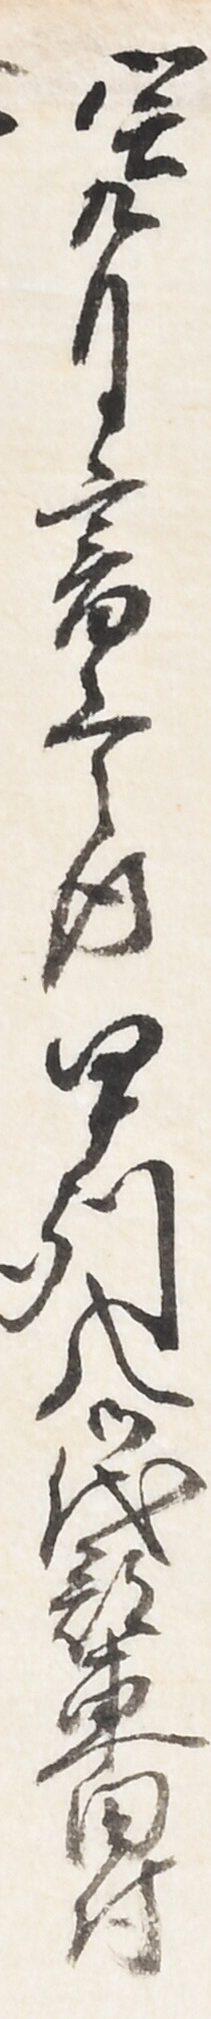閏九月書上之内甲州八ツ代郡車田村
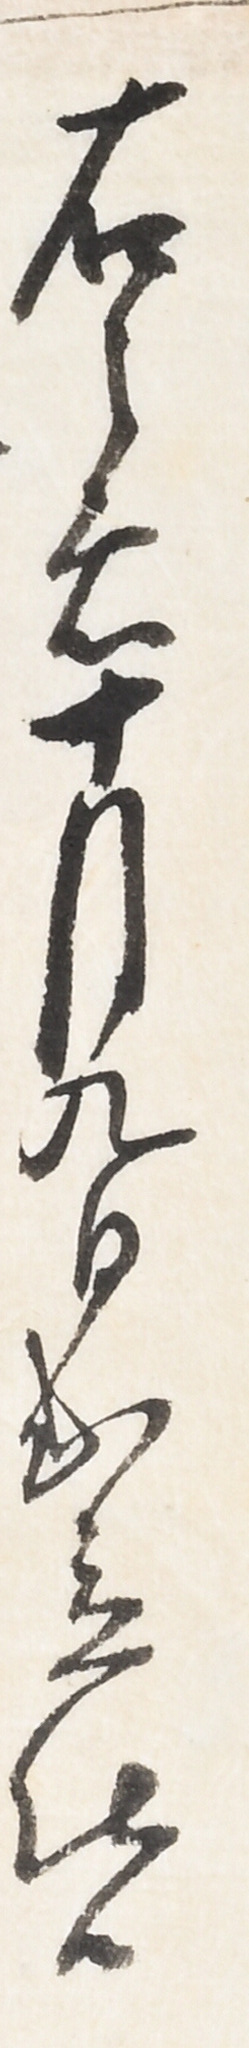右之者十月九日出立仕候
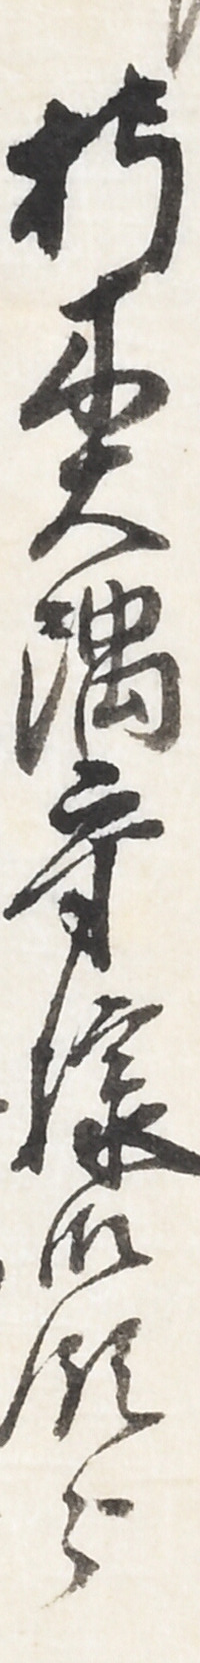朽木大隅守様御領分
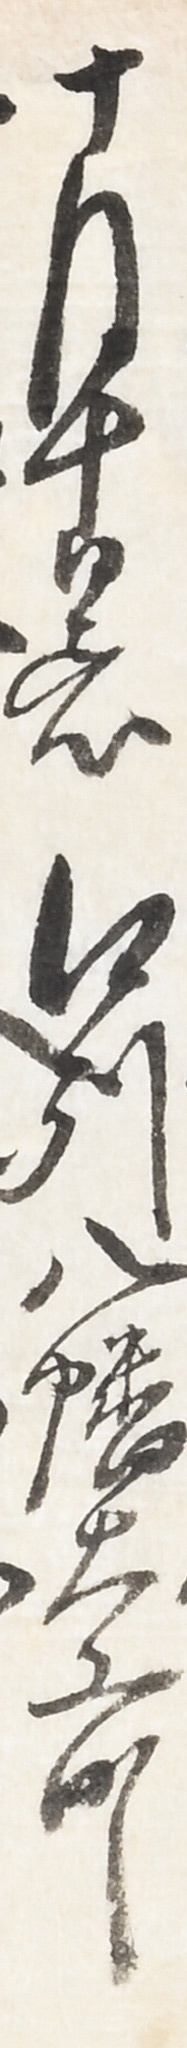十月十日着江州八幡大工町
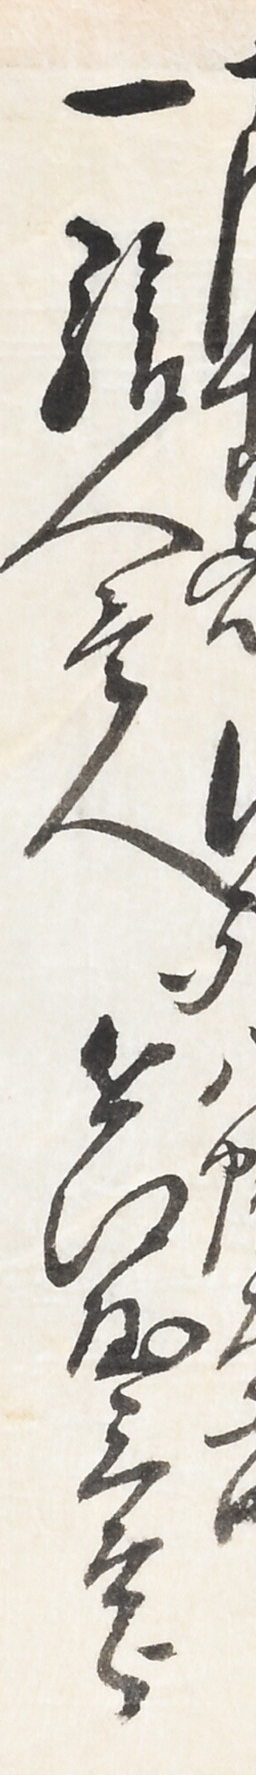一旅人壱人近江屋三兵衛
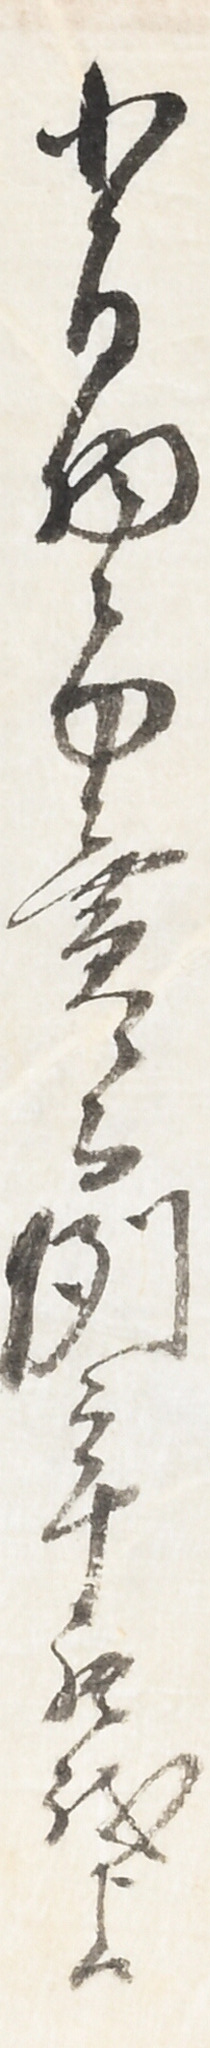小間物商売ニ而例年罷越申候
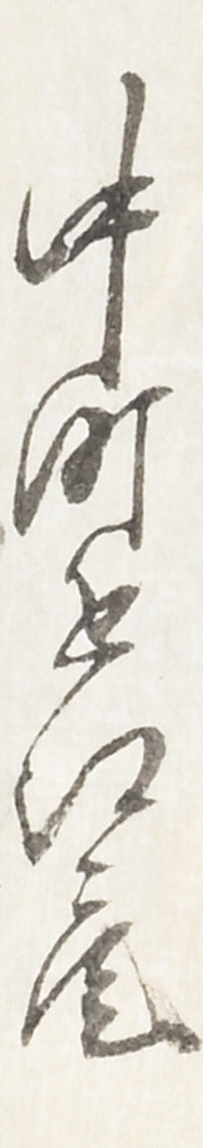中町近江屋
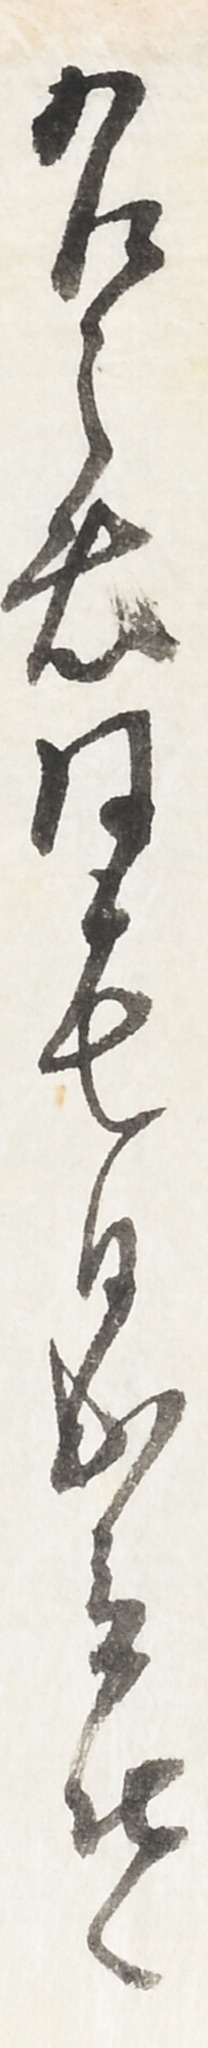右之者同月七日出立仕候
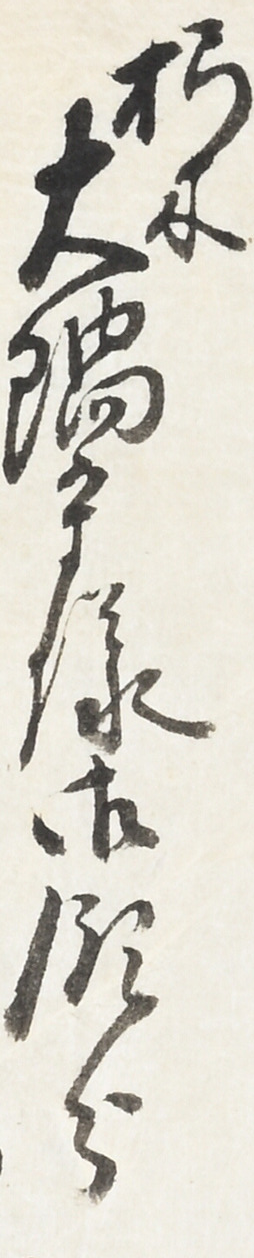大隅守様御領分
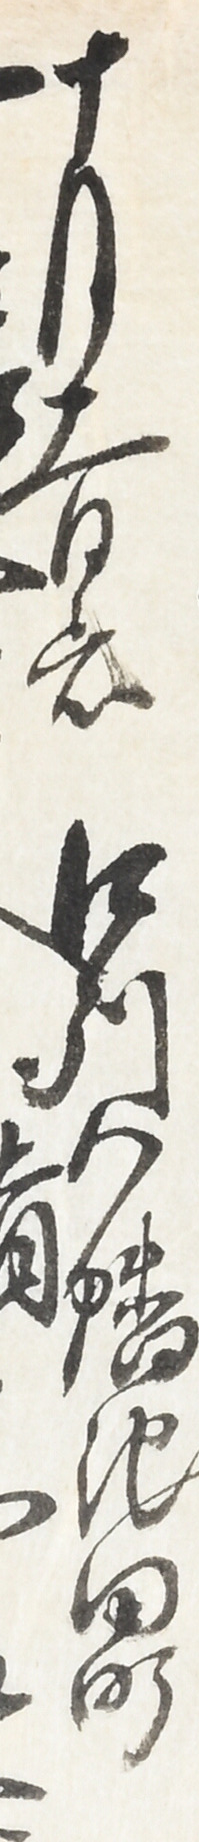十月十一日着江州八幡池田町
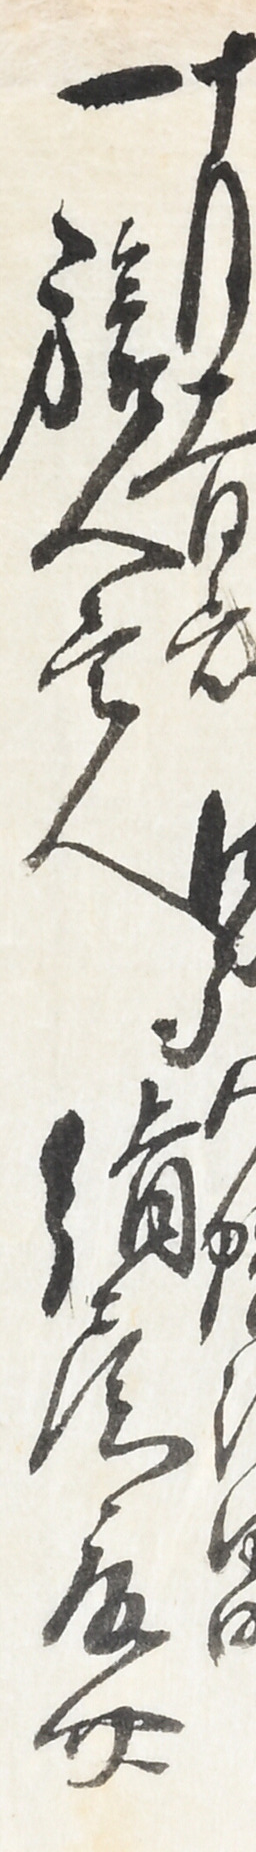一旅人壱人絹屋藤介
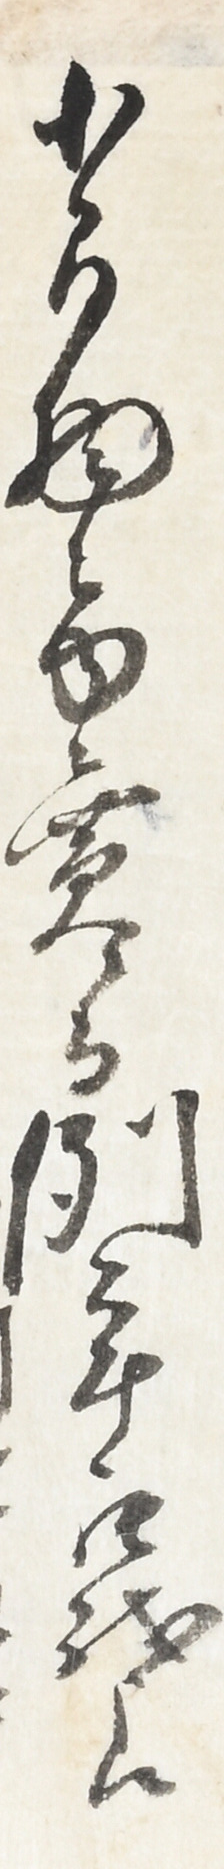小間物商売ニ而例年罷越申候
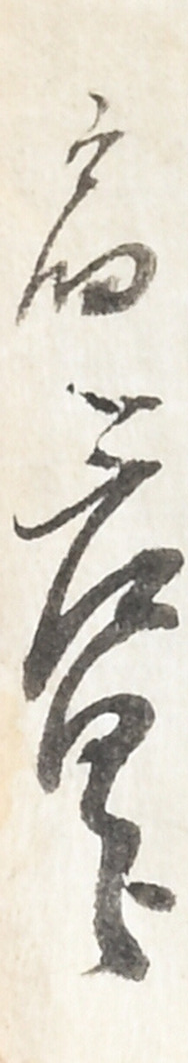宿善四郎

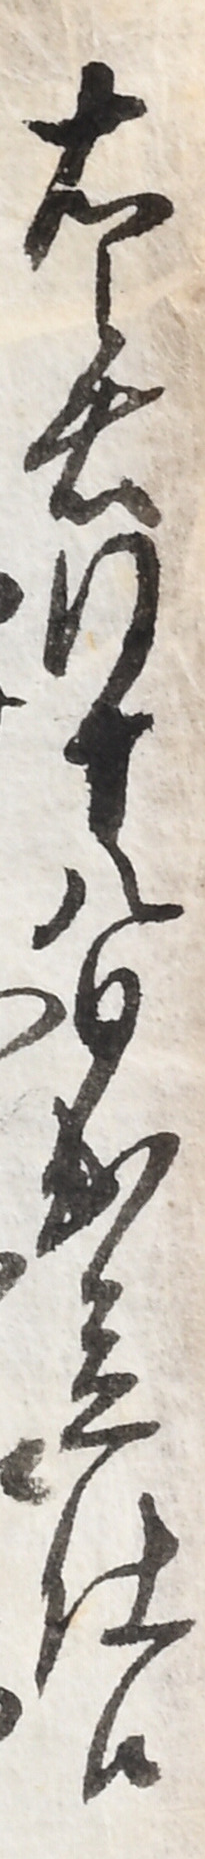右之者同壱八日出立仕候
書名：旅人泊控帳
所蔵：伊那市立高遠町図書館・合同会社AMANE
